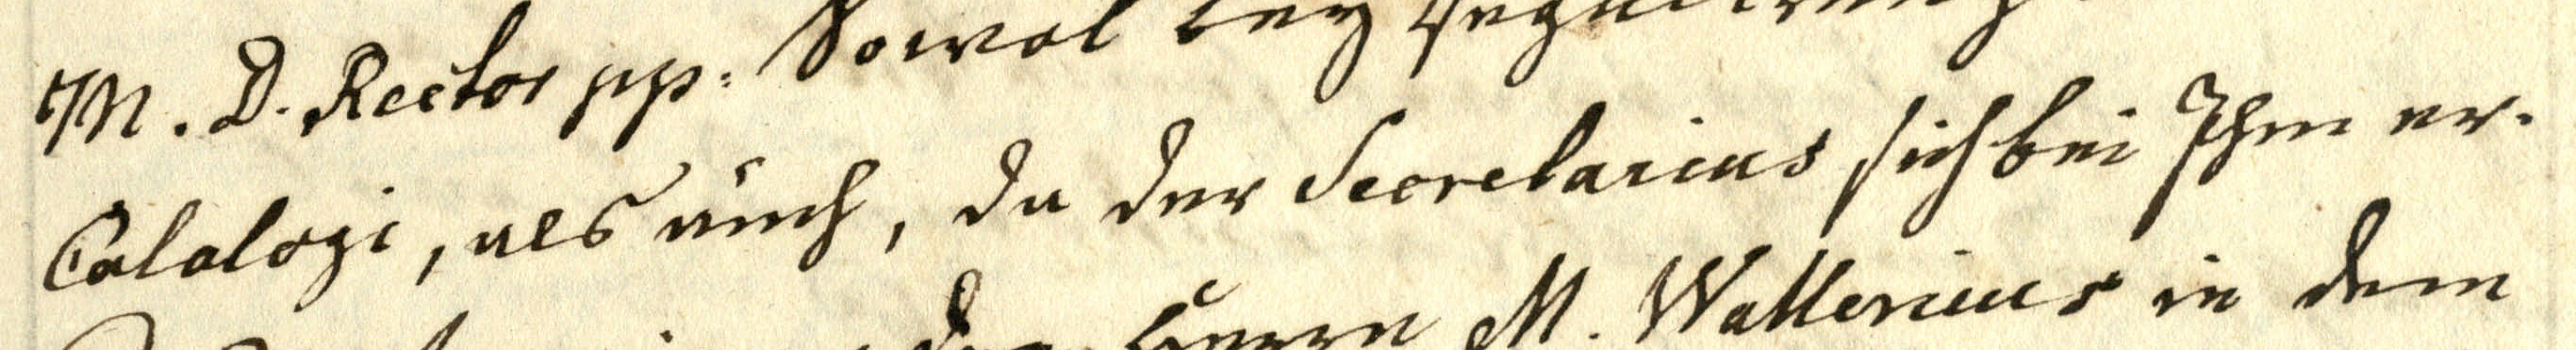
Catalogi, als auch, da der Secretarius sich bei Ihm er¬
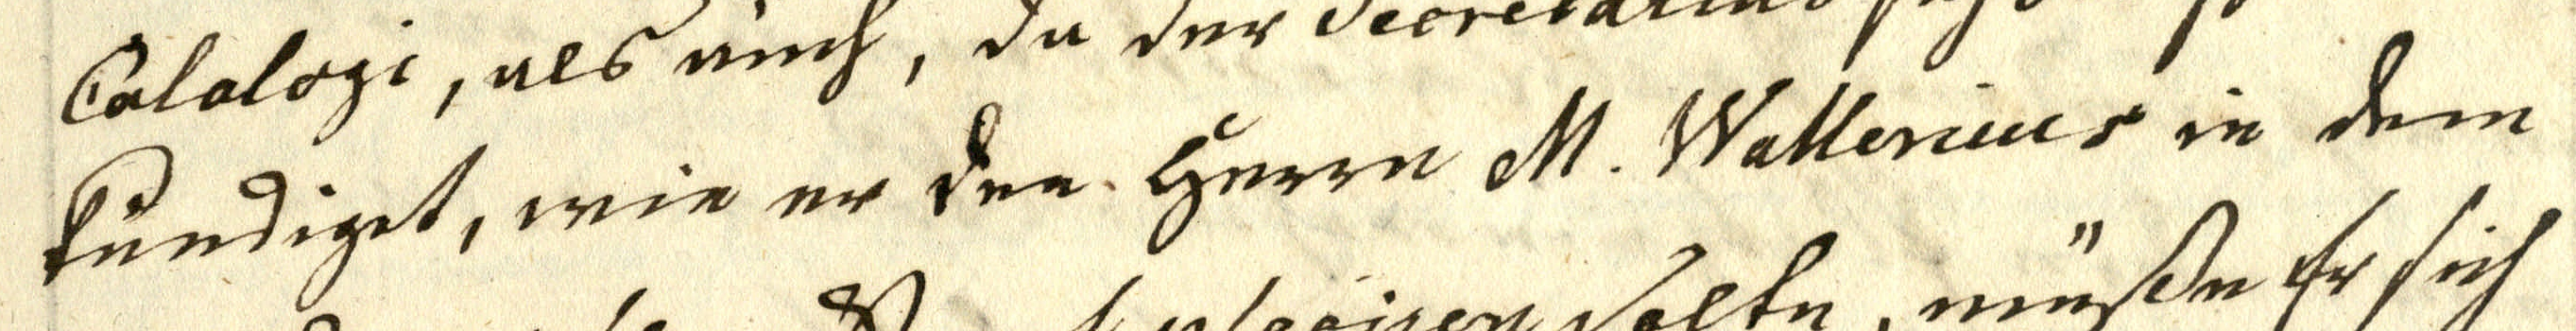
kundiget, wie er den Herrn M. Wallenius in dem
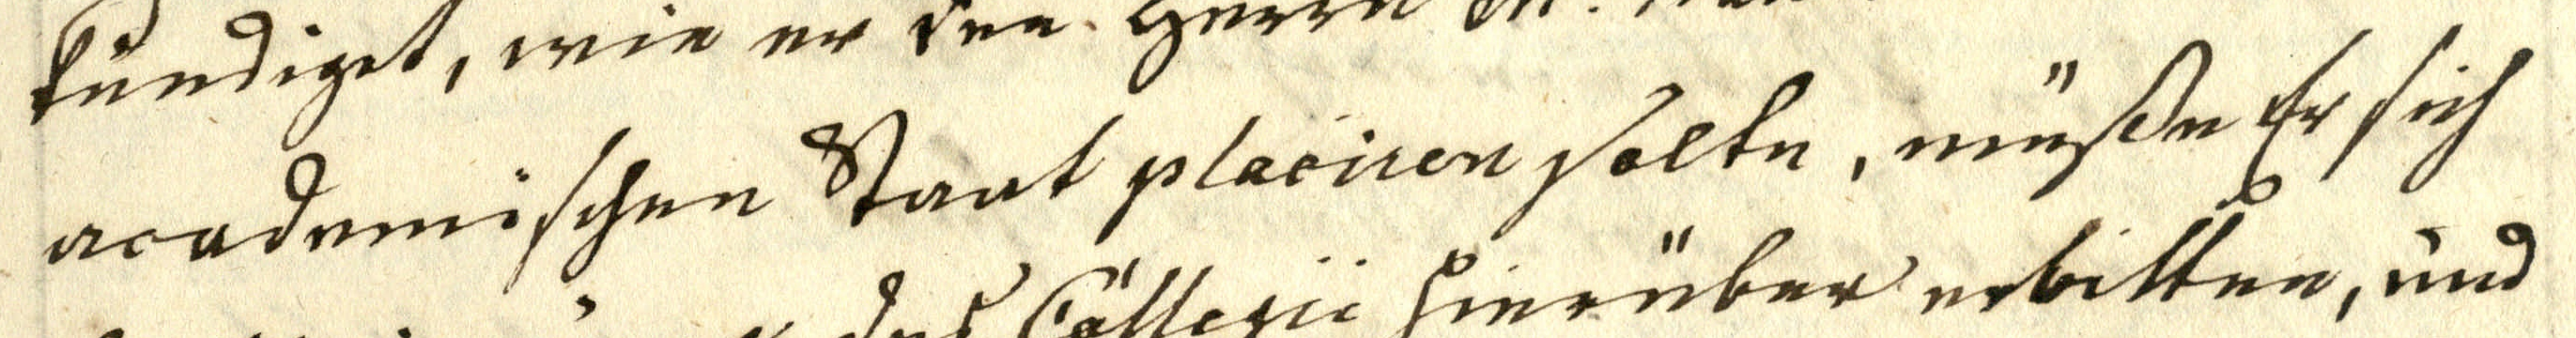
academischen Staat placiren solte, müße Er sich
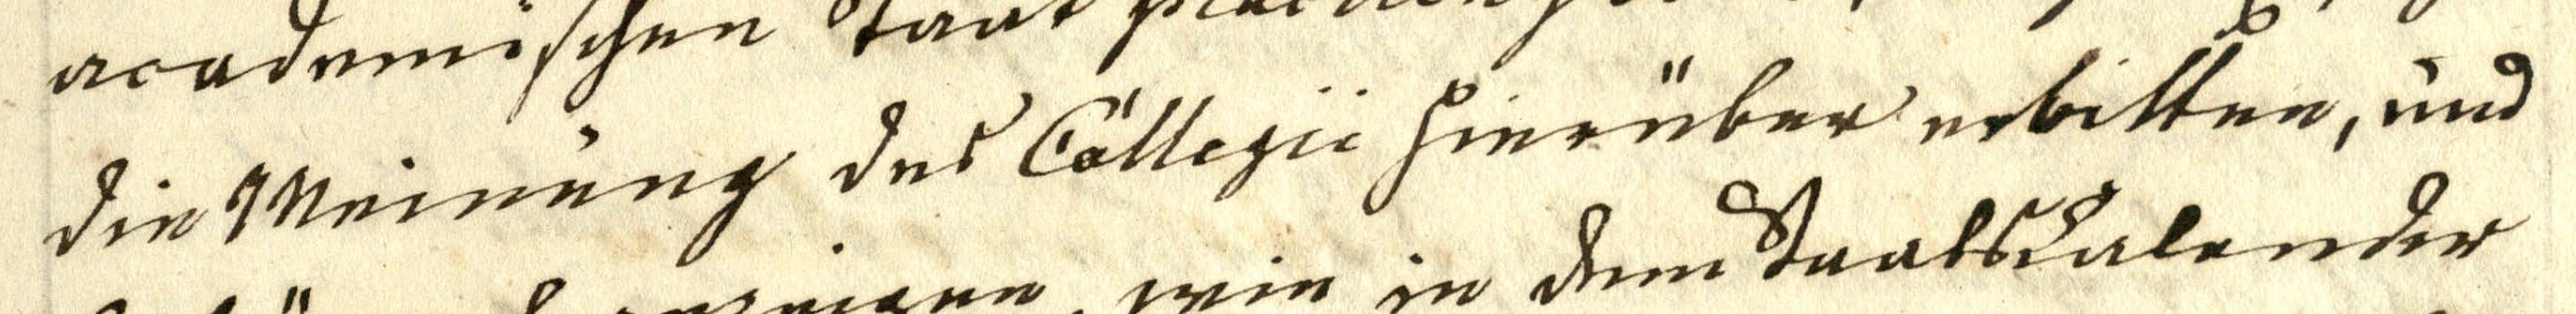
die Meinung des Collegii hierüber erbitten, und
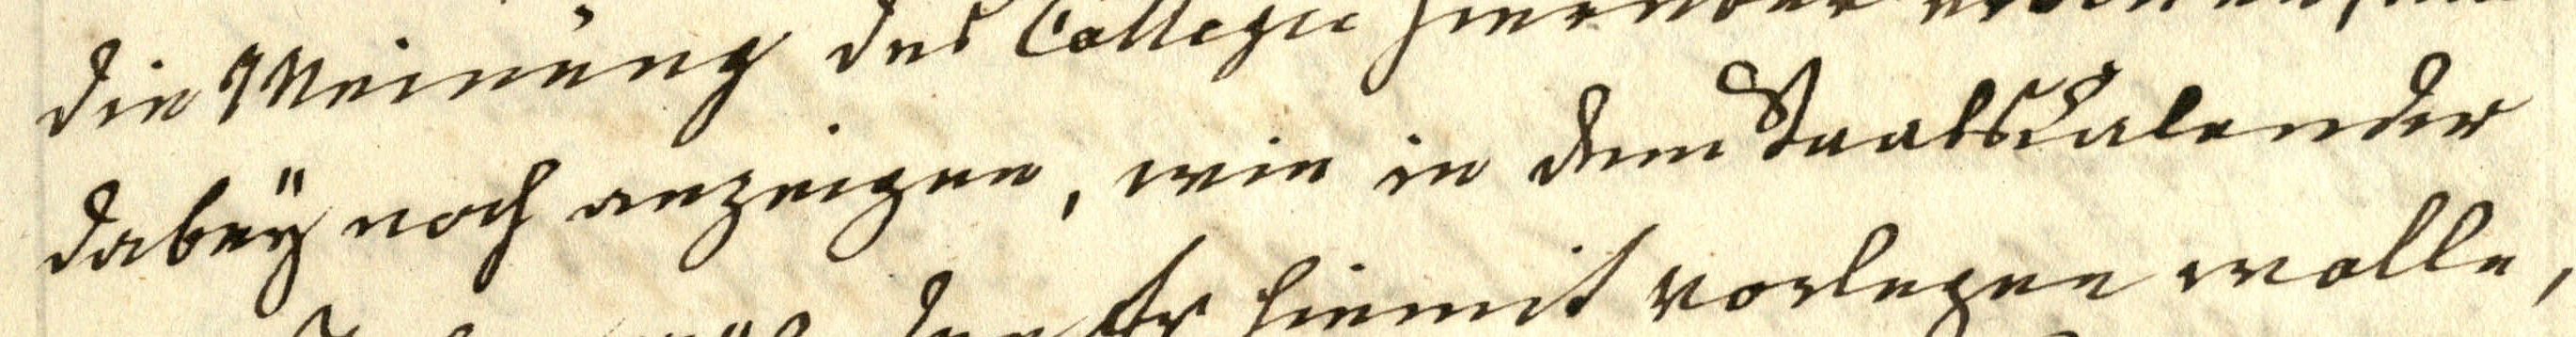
dabeÿ noch anzeigen, wie in dem Staatskalender
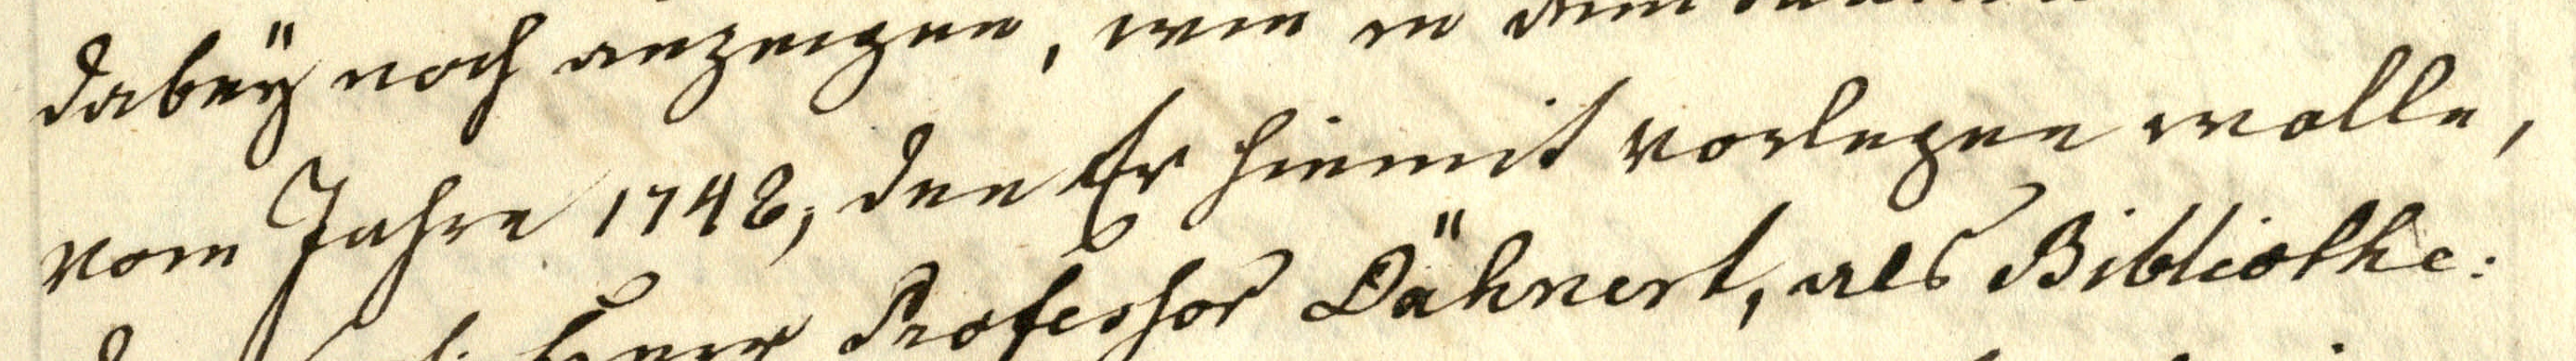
vom Jahre 1748, den Er hiemit vorlegen wolle,
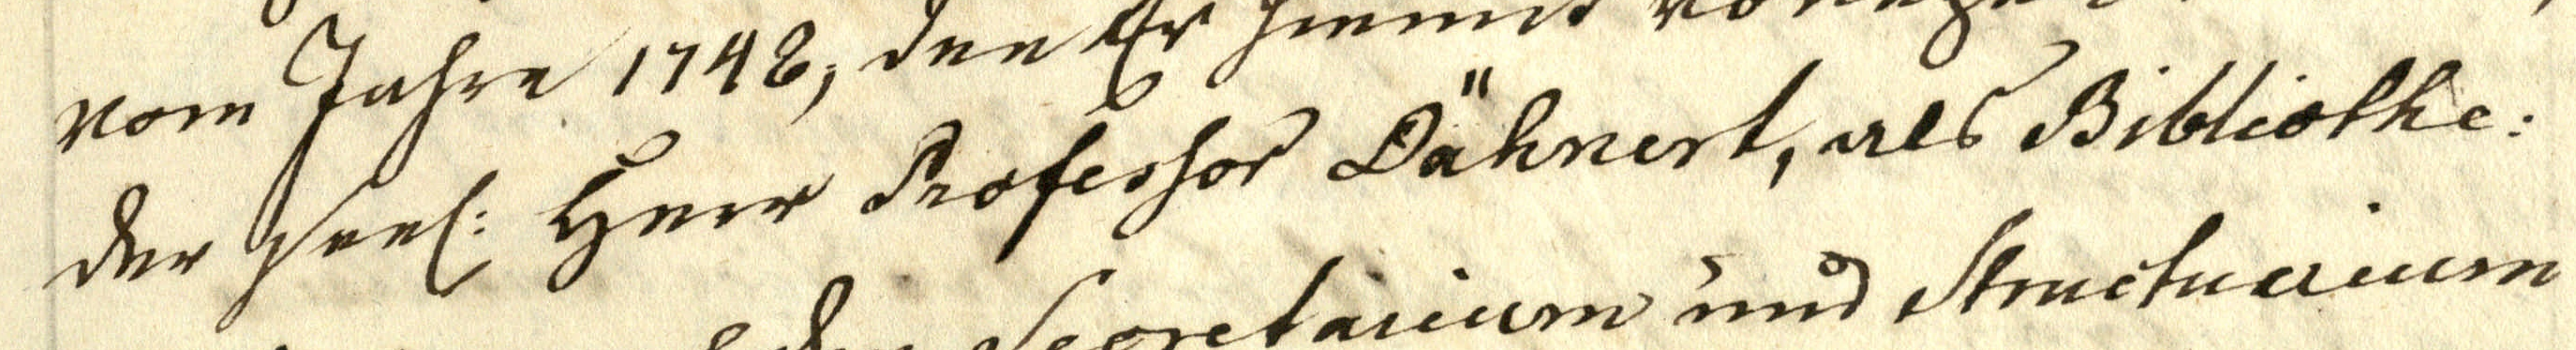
der seel. Herr Professor Dähnert, als Bibliothe¬
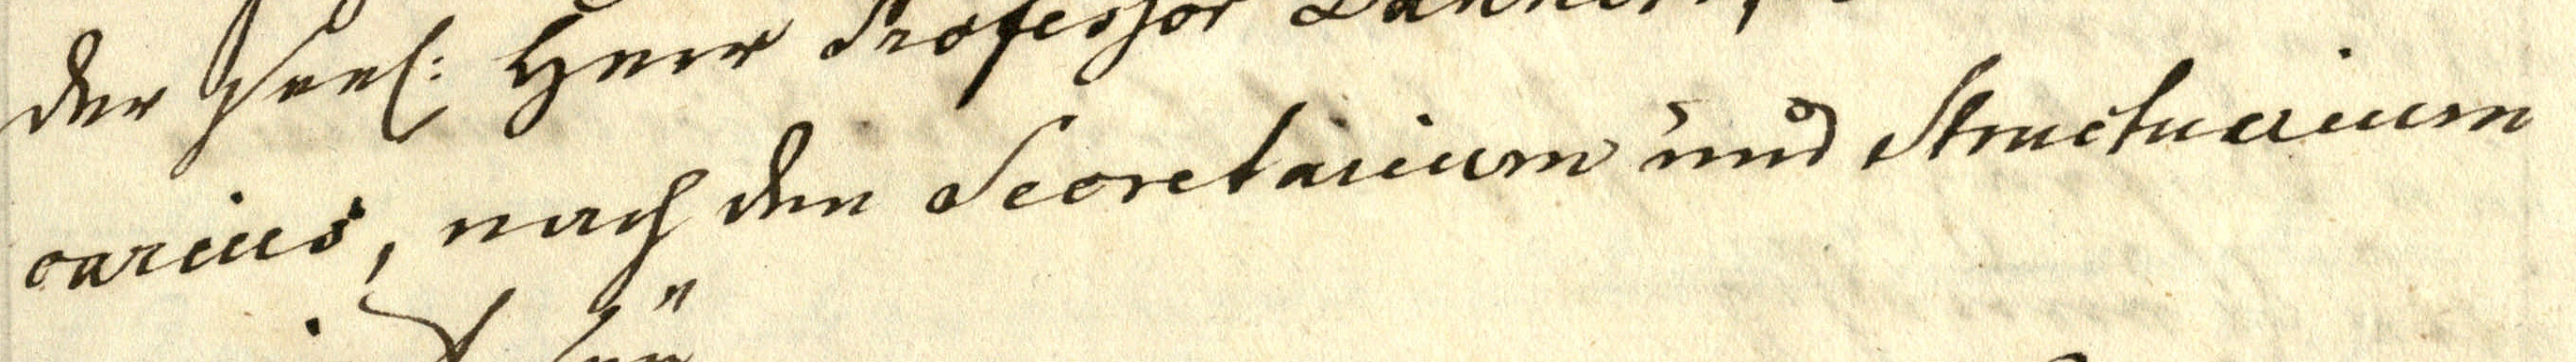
carius nach dem Secretarium und Structuarium
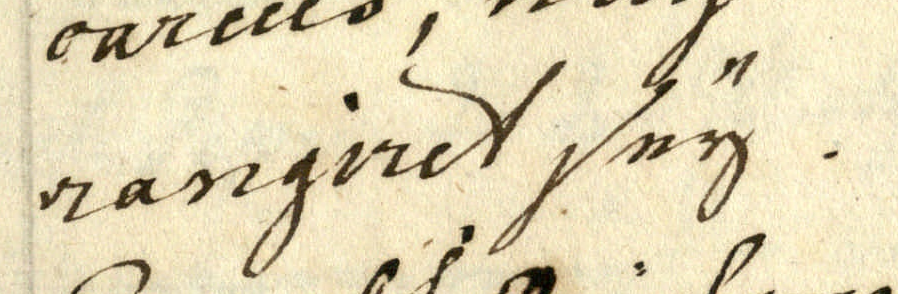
rangiret seÿ.
